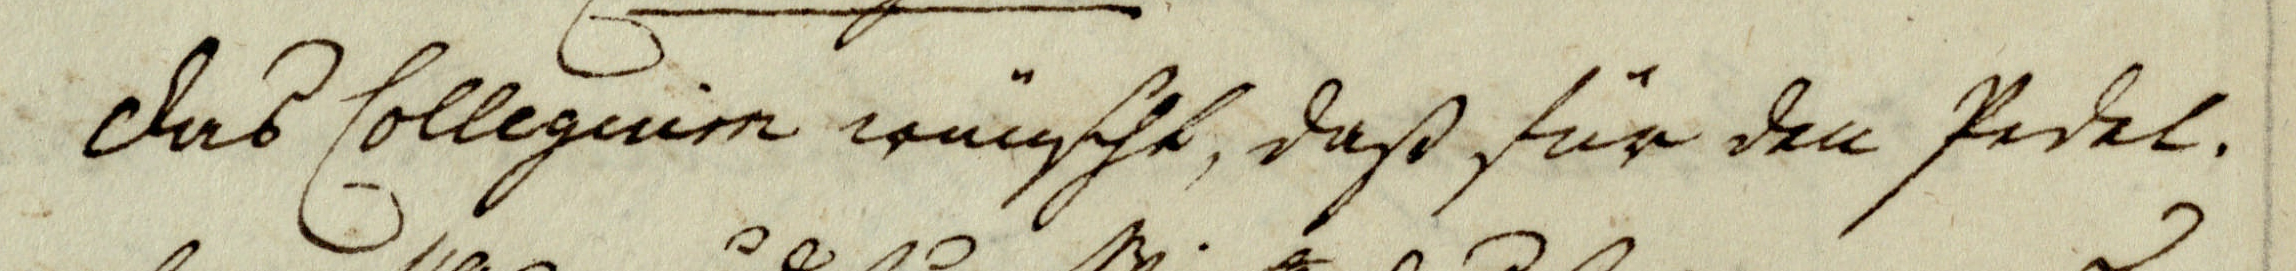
Das Collegium wünscht, daß für den Pedel¬
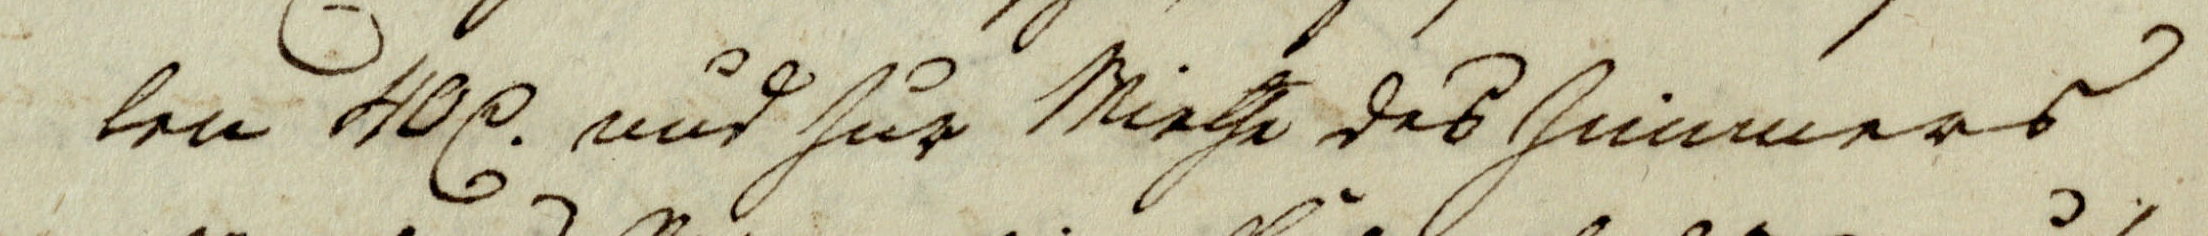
len 40 l. und zur Miethe des Zimmers
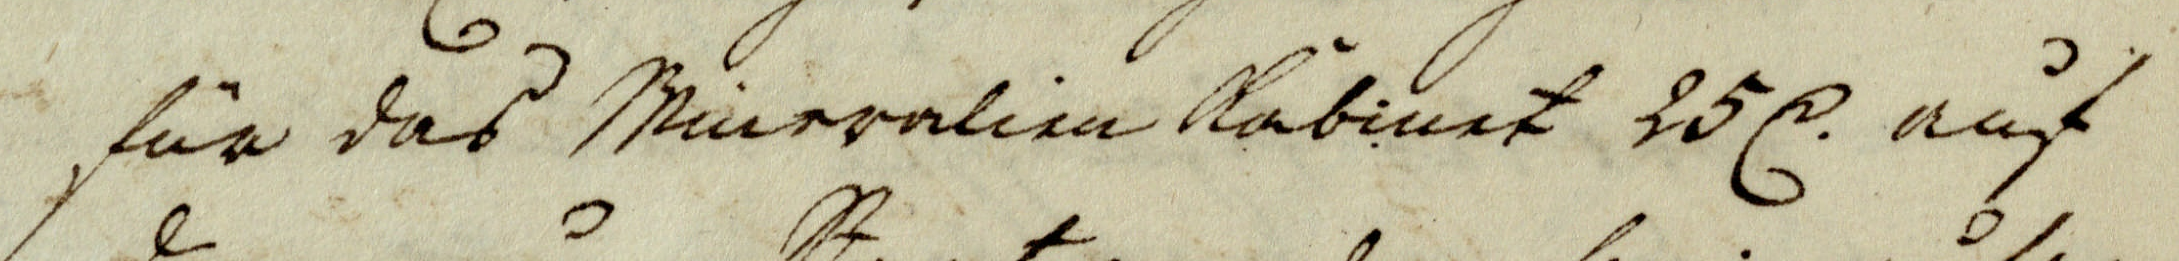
für das Mineralien Kabinet 25 l. auf
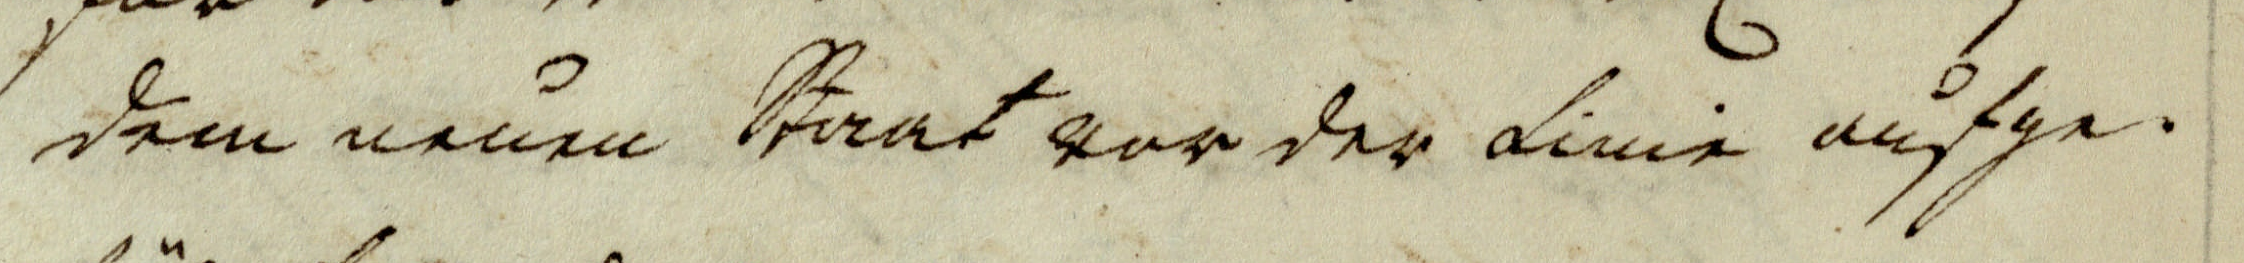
dem neuen Staat vor der Linie aufge¬
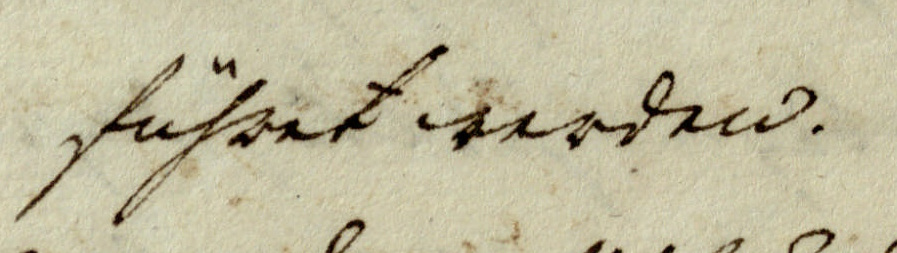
führet werden.
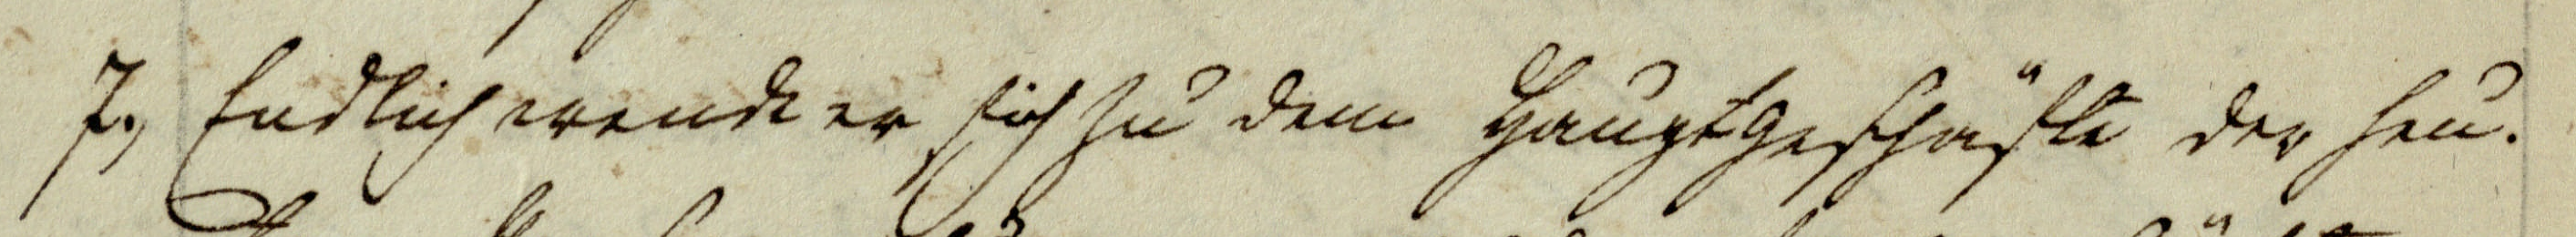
7. Endlich wende er sich zu dem Hauptgeschäfte der heu¬
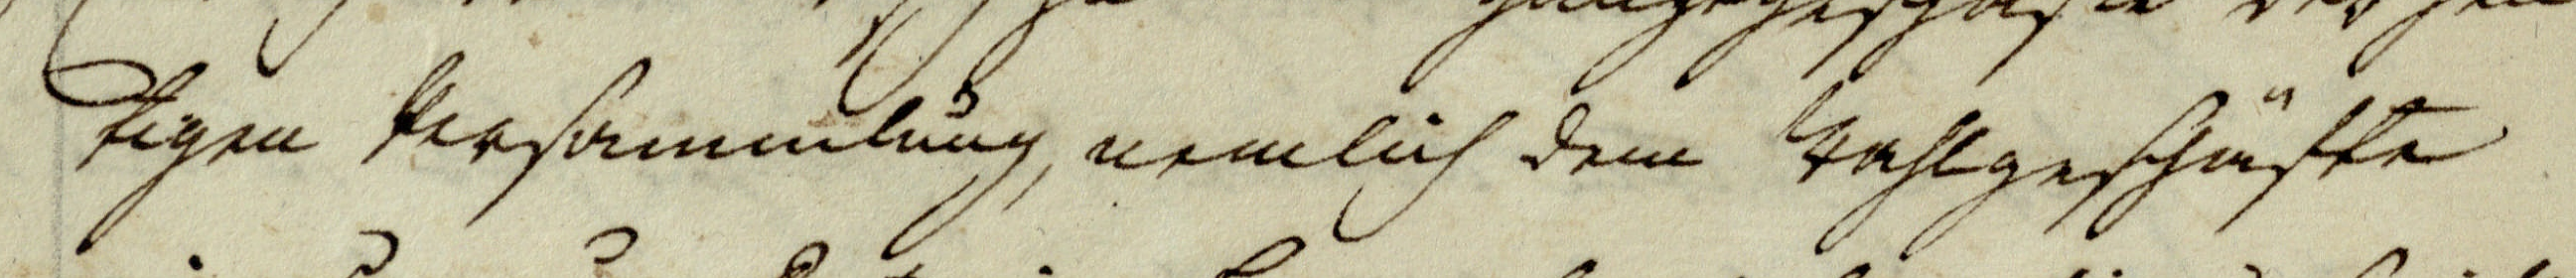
digen Versammlung, nemlich dem Wahlgeschäfte
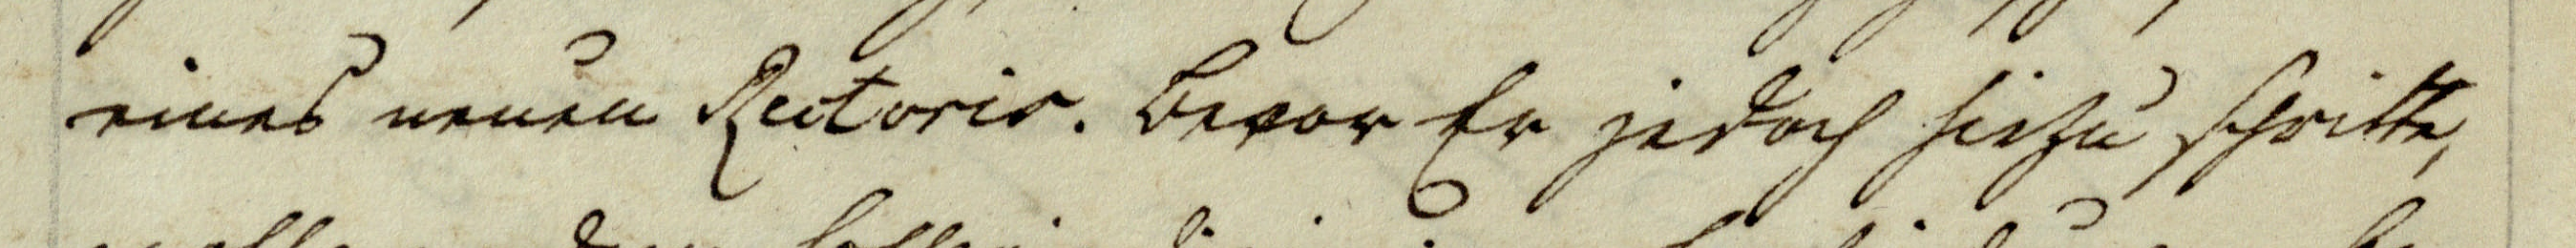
eines neuen Rectoris. bevor Er jedoch hiezu schritte,
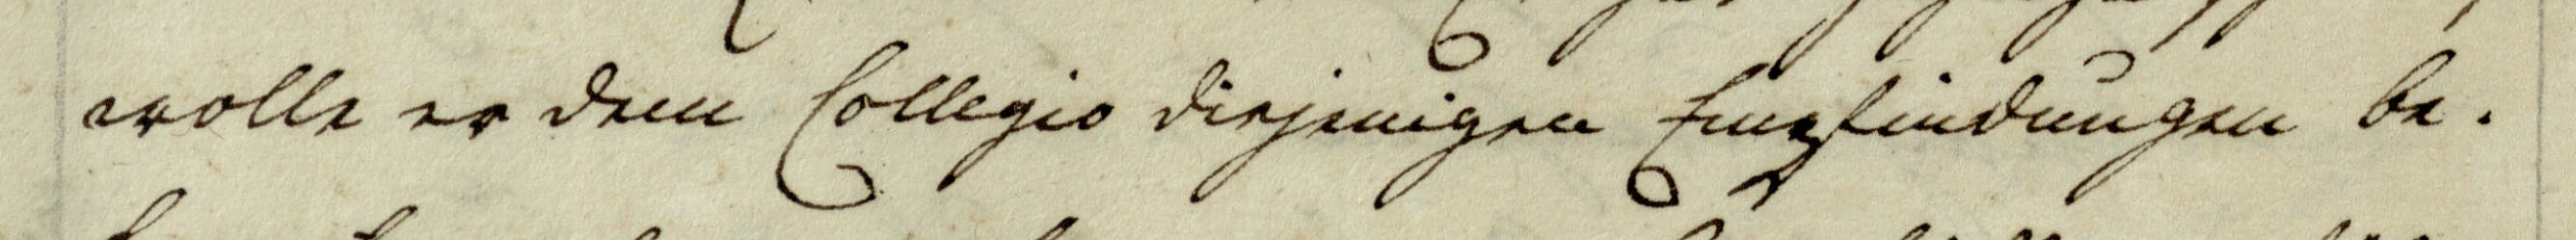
wolle er dem Collegio diejenigen Empfindungen be¬
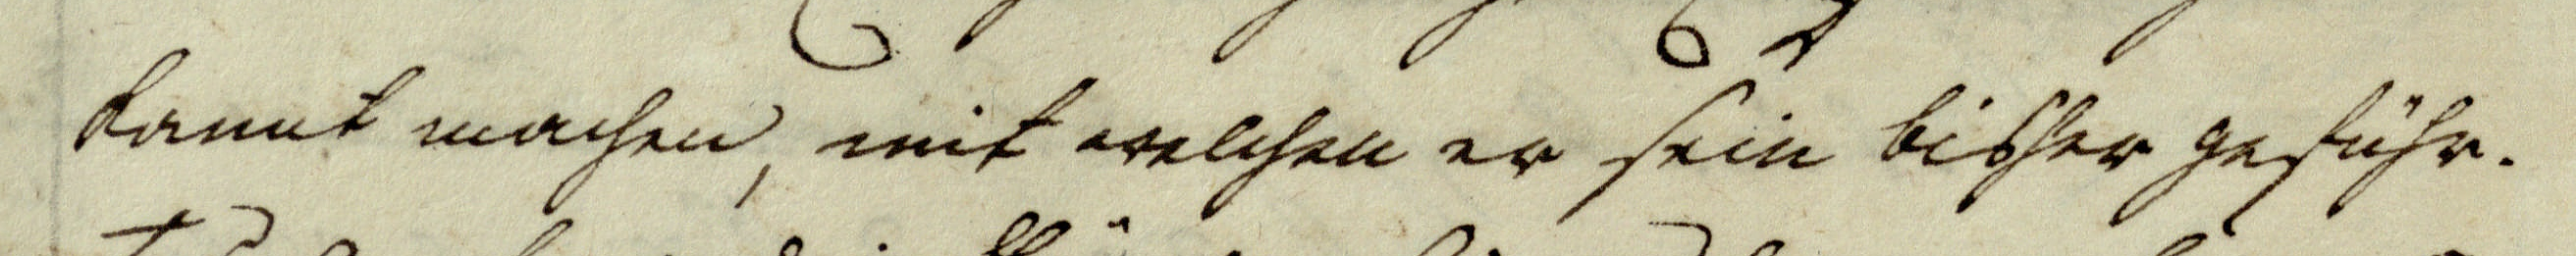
kannt machen, mit welchen er sein bisher geführ¬
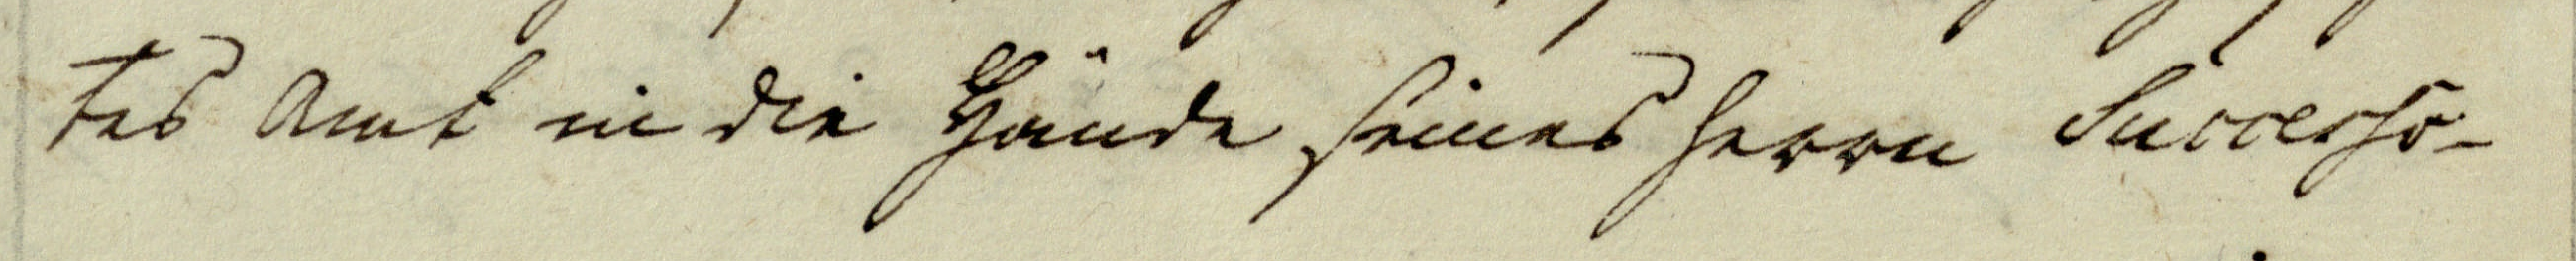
tes Amt in die Hände seines Herrn Successo¬
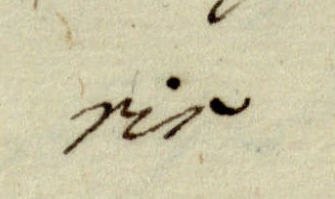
ris
